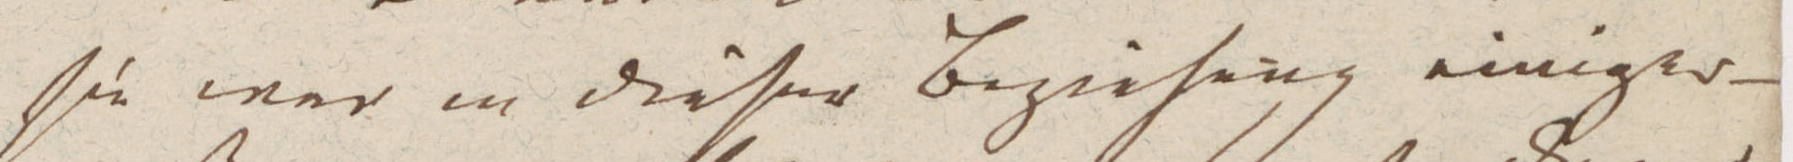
sie war in dieser Beziehung einiger-
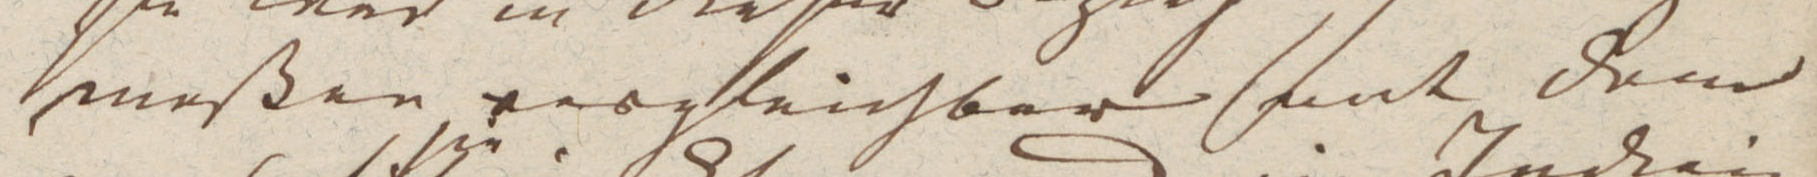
massen vergleichbar mit dem
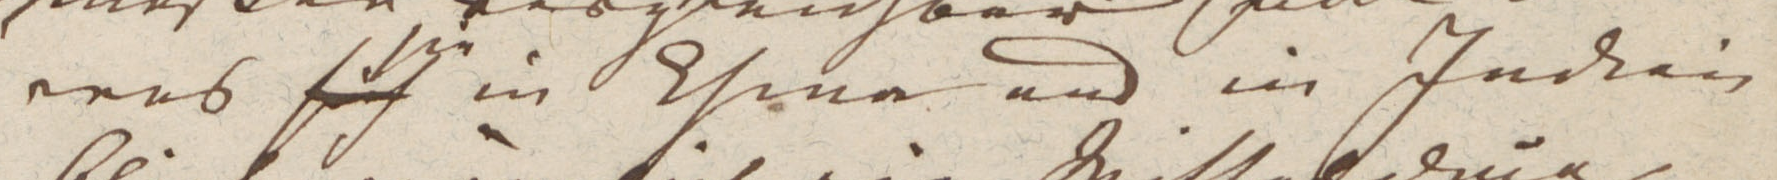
was sich sie in China und in Indien
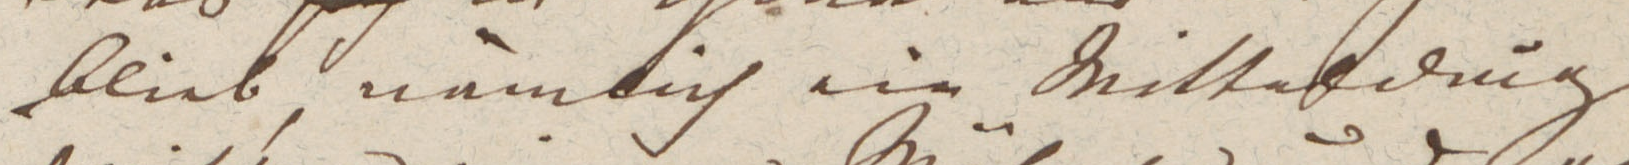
blieb, nämlich ein Mittelding
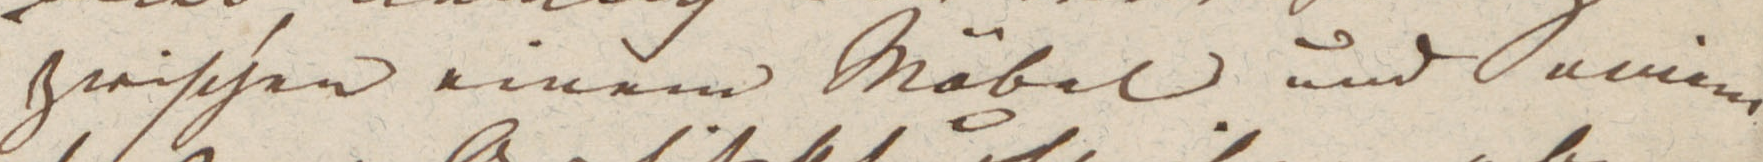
zwischen einem Möbel und einem
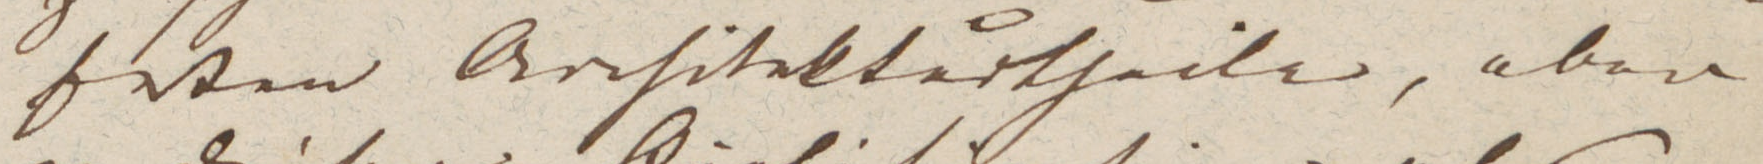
festen Architekturtheile, aber
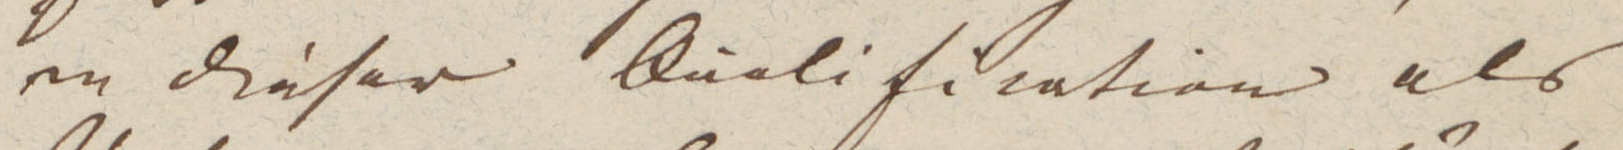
in dieser Qualification als
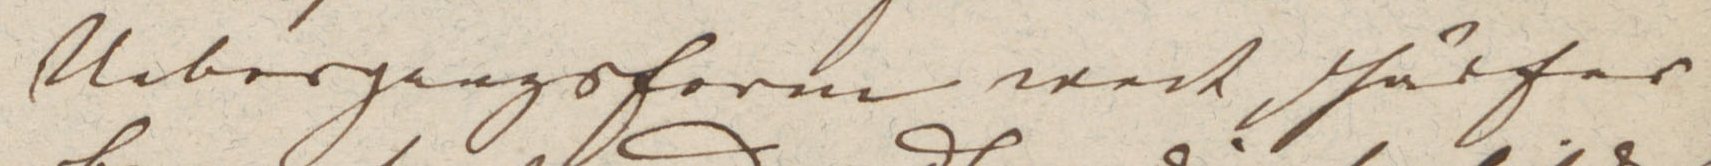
Uebergangsform weit schärfer
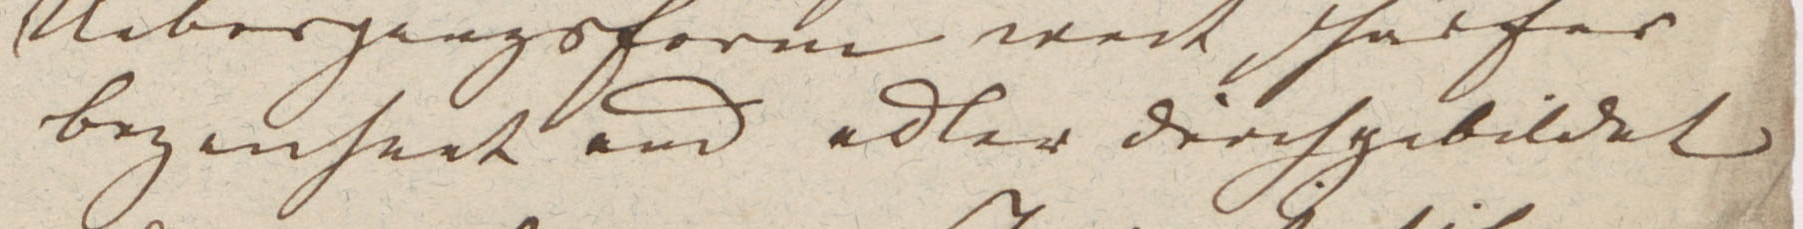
bezeichnet und edler durchgebildet
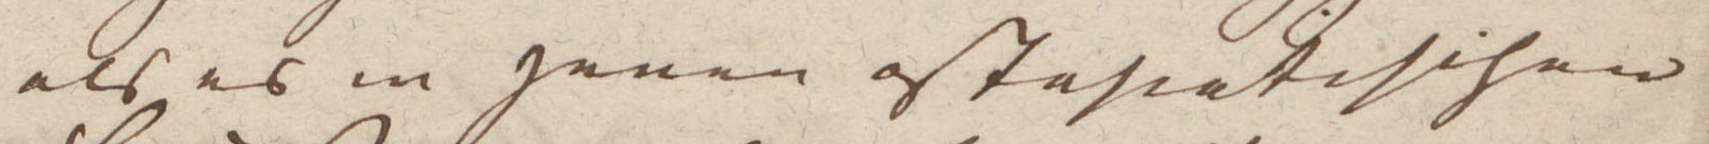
als es in jenen ostasiatischen
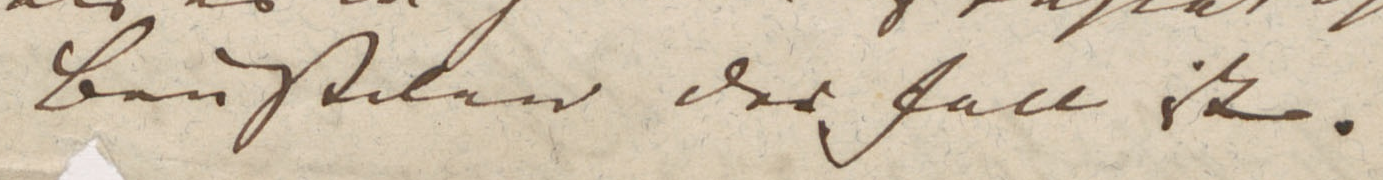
Baustilen der Fall ist.
